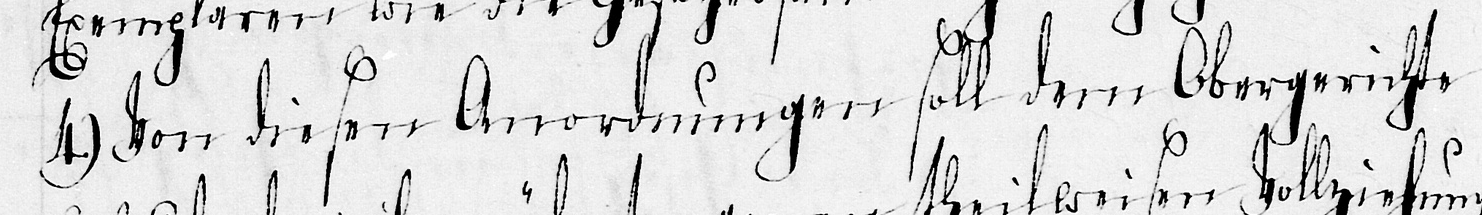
4.) Von diesen Anordnungen soll dem Obergerichte
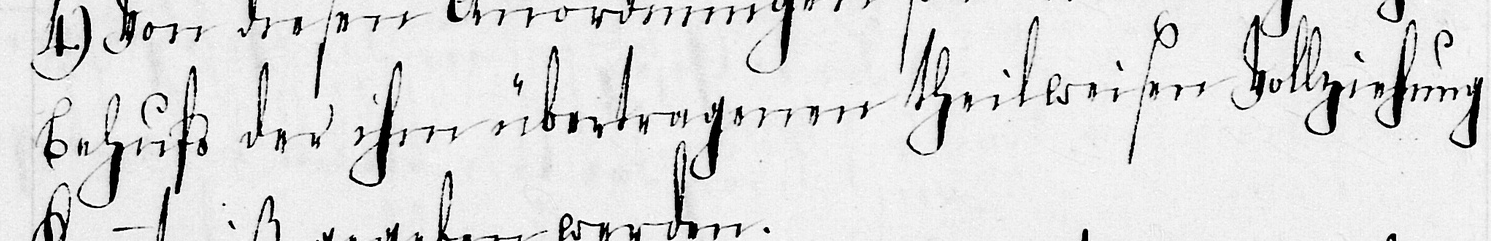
behufs der ihm übertragenen theilweisen Vollziehung
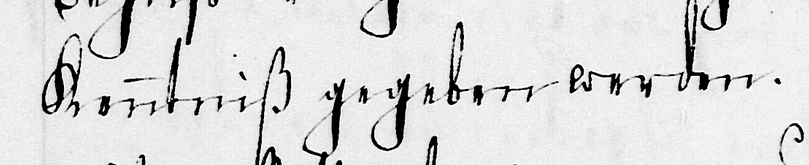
Kenntniß gegeben werden.
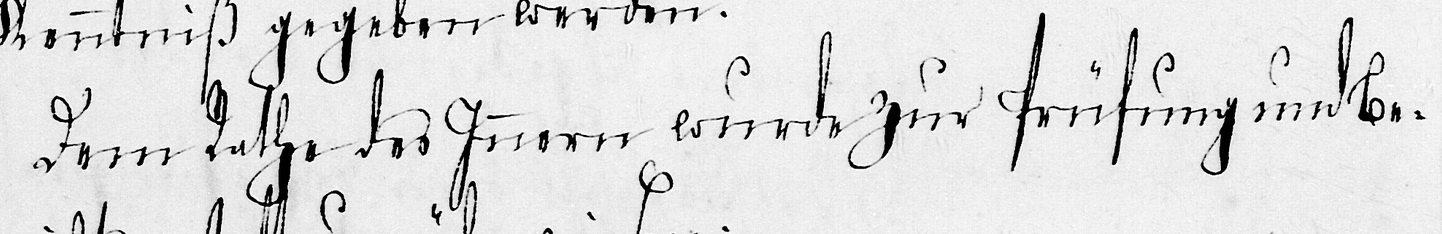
Dem Rathe des Innern wurde zur Prüfung und Be¬
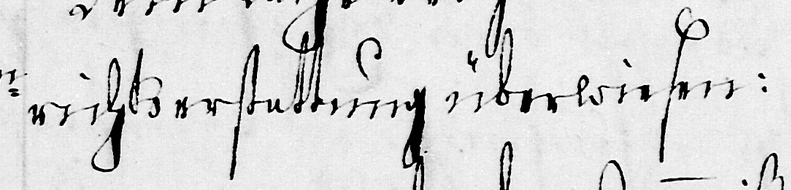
richtserstattung überwiesen:
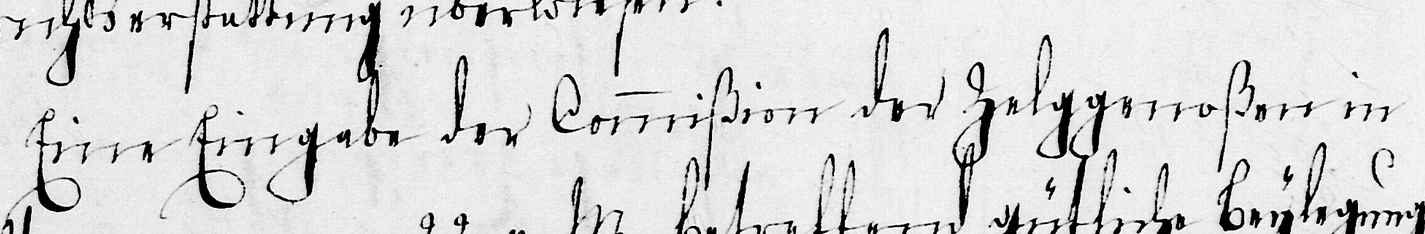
Eine Eingabe der Commißion der Zelggenoßen in
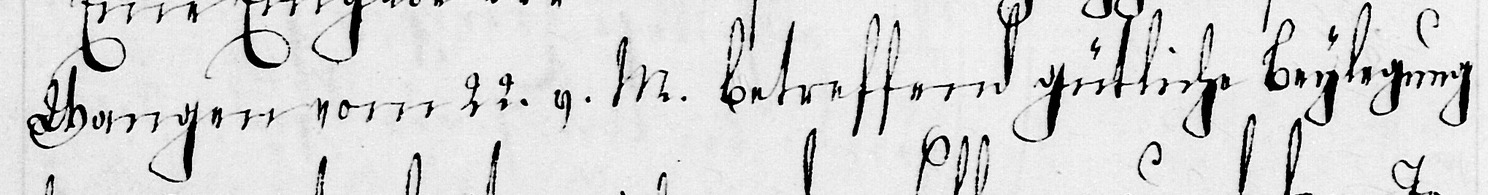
Wangen vom 22. v. M. betreffend gütliche Beylegung
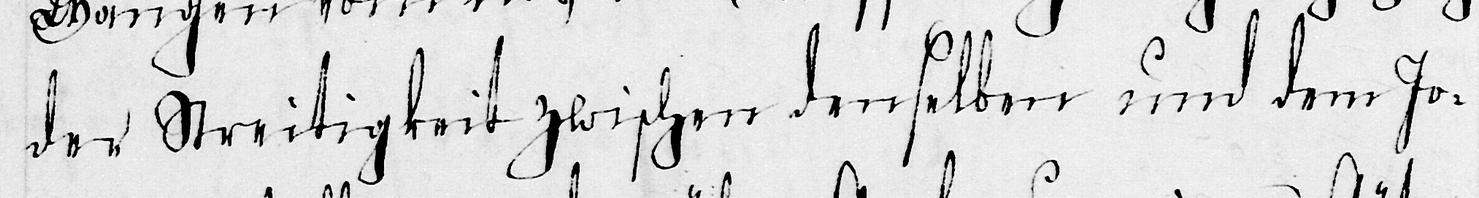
der Streitigkeit zwischen denselben und dem Jo¬
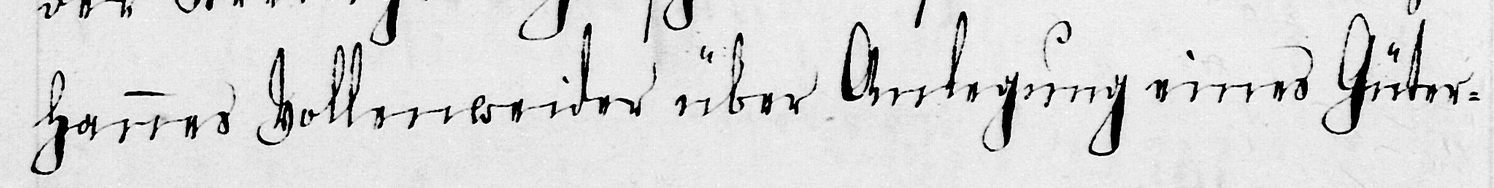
hannes Vollenweider über Anlegung eines Güter¬
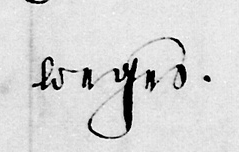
weges.
